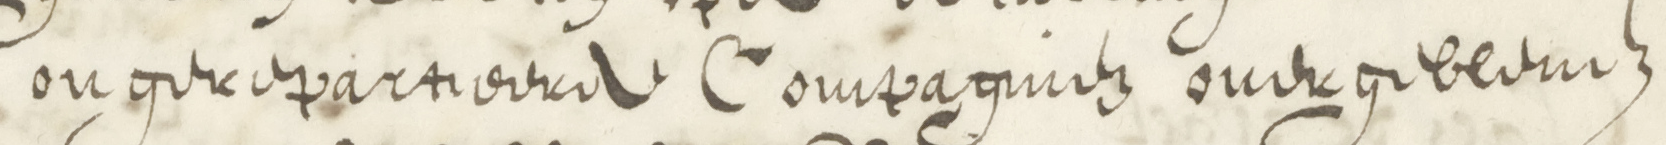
ongerepartieerde Compagnien ouergebleuen
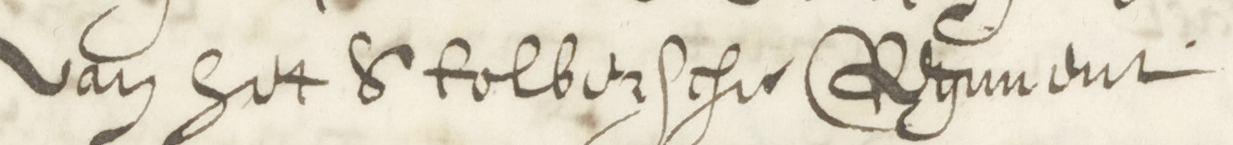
van het Stolbersche Regiment
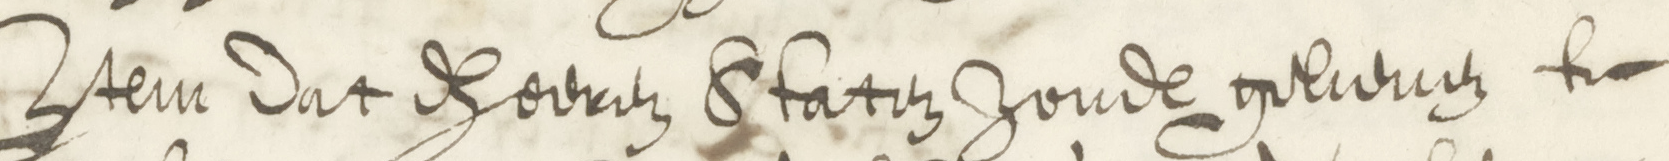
Item dat dheeren Staten zoude gelieuen te
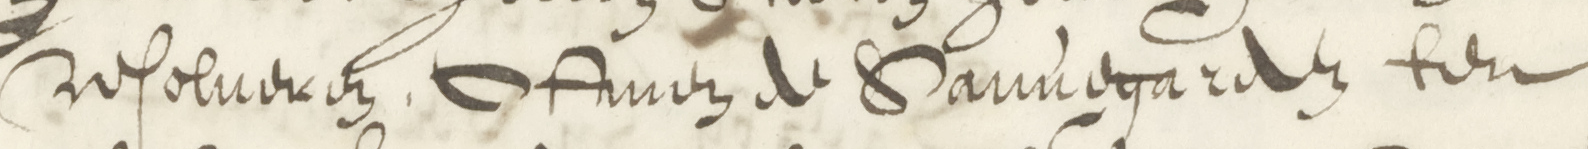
resolueren, Oftmen de Sauuegarden ten
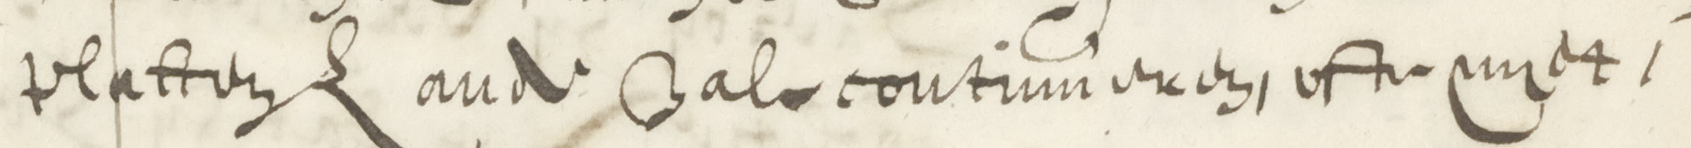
plattenlande zal continueren, ofte nyet.
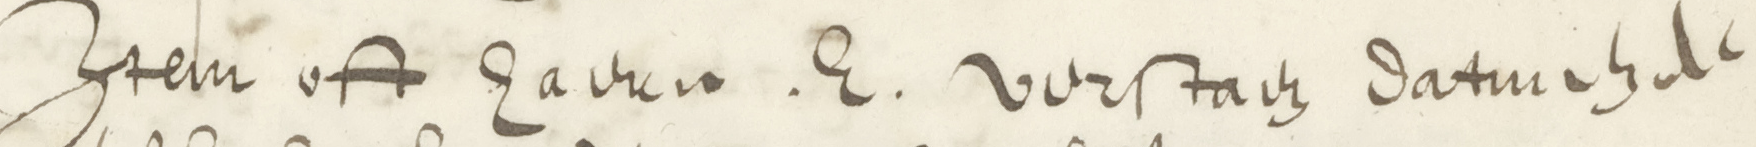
Item oft haer E. verstaen datmen de
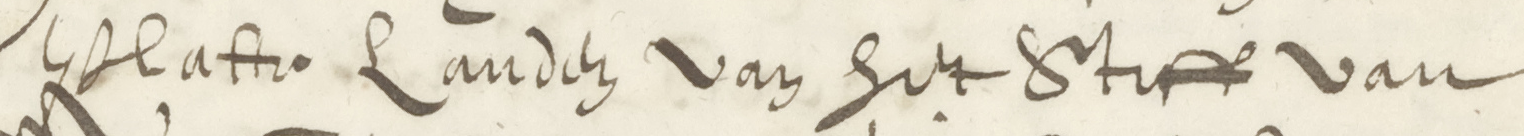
Platte Landen van het Stift van
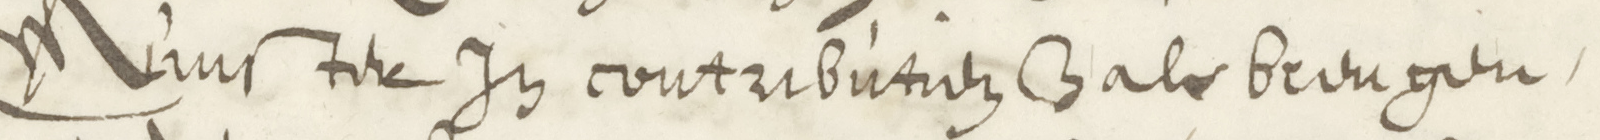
Munster In contributien zal brengen,
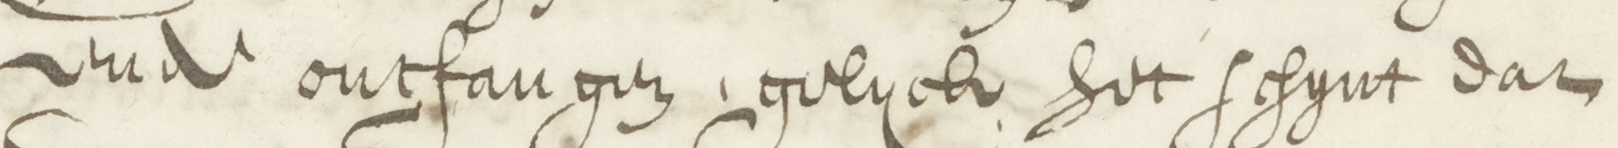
ende ontfangen, gelyck het schynt dat
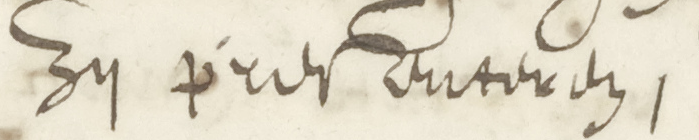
zy presenteren.
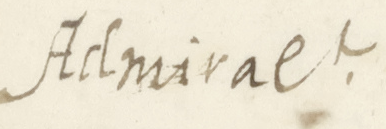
Admiralt.
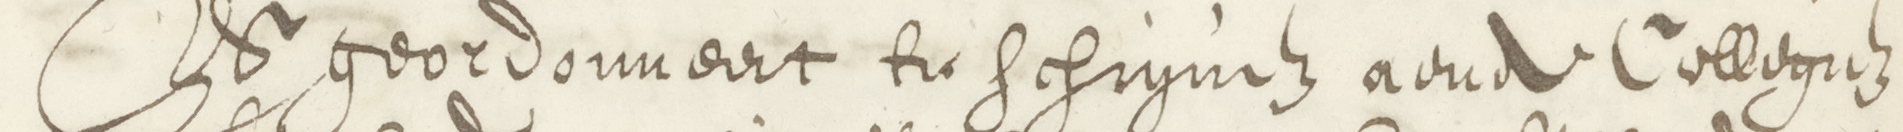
Is geordonneert te schryuen aende Collegien
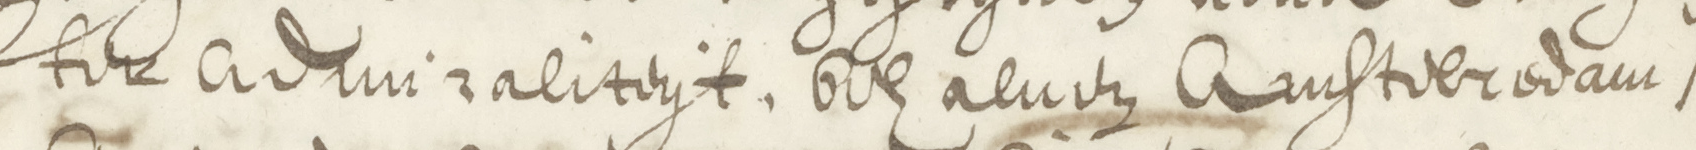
ter Admiraliteijt, behaluen Amstelredam,
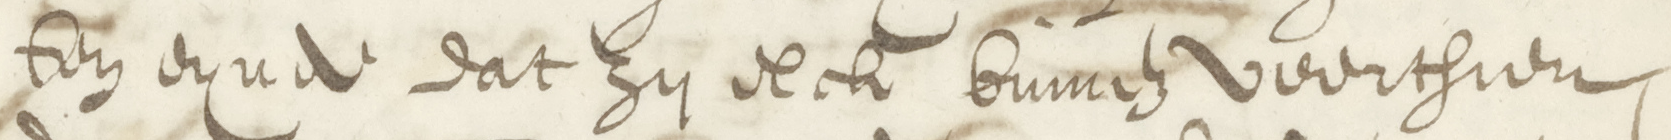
ten eynde dat zy elck binnen veerthien
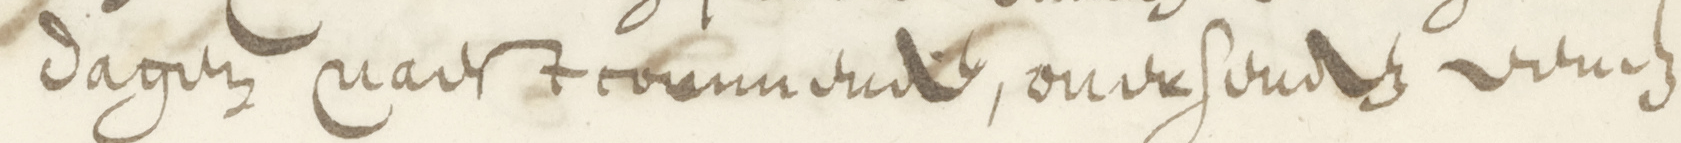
dagen naestcommende, ouersenden eenen
